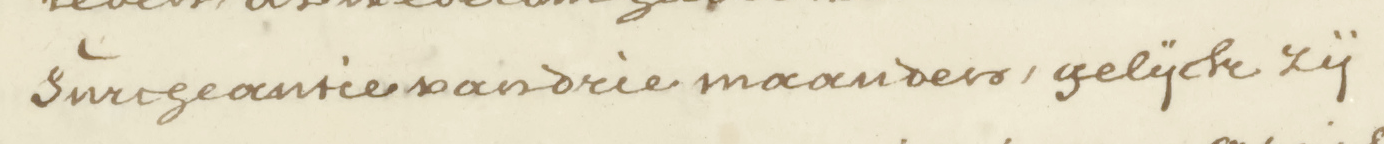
surcheantie van drie maanden, gelijck zij
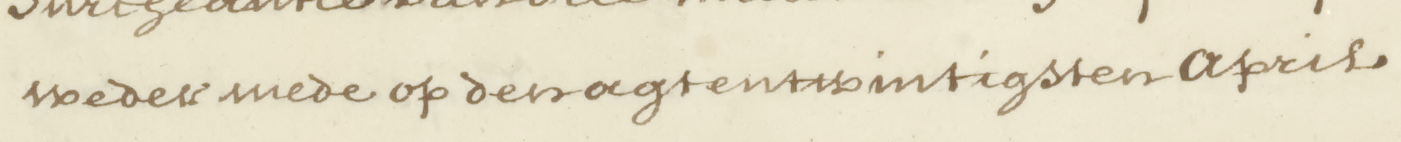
weder mede op den agtentwintigsten april
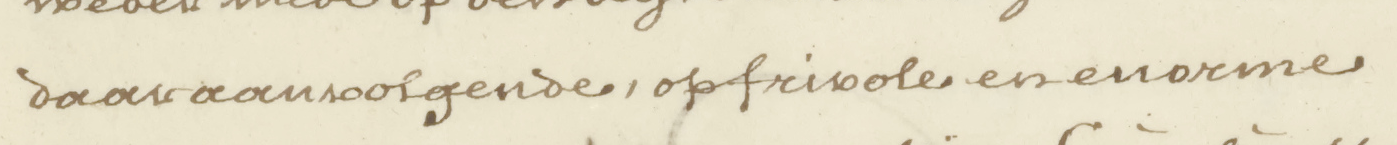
daaraan volgende, op frivole en enorme
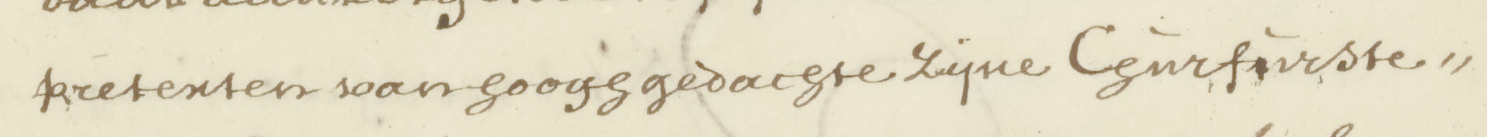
pretexten van hooghgedachte zijne Churfurste„
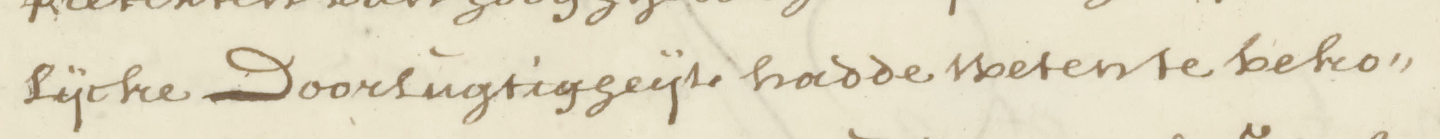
lijcke Doorlugtigheijt hadde weten te beko,,
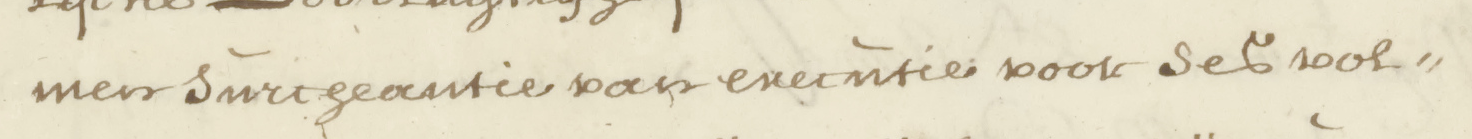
men surcheantie van executie voor ses vol„
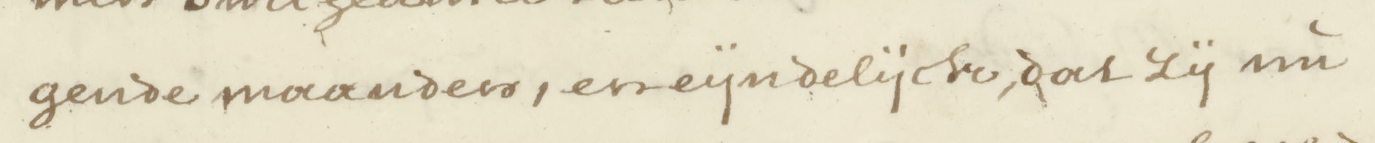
gende maanden, en eijndelijck dat zij nu
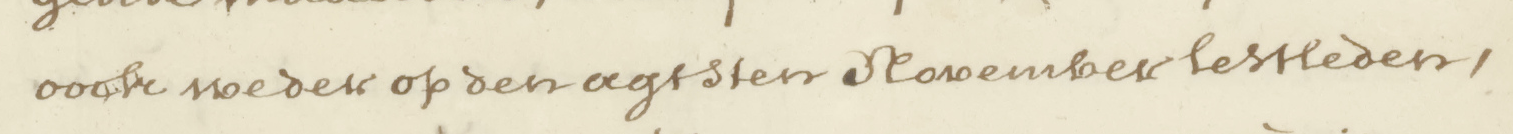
oock weder op den agtsten November lestleden,
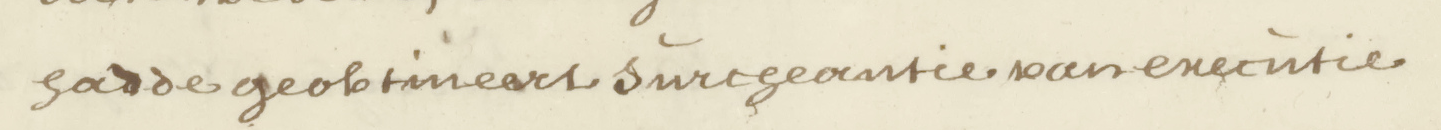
hadde geobtineert surcheantie van executie
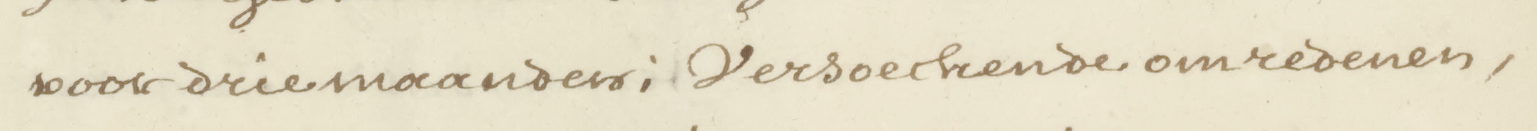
voor drie maanden: Versoeckende omredenen,
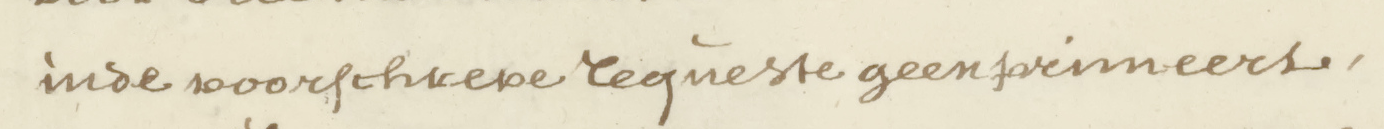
inde voorschreve requeste geexprimeert,
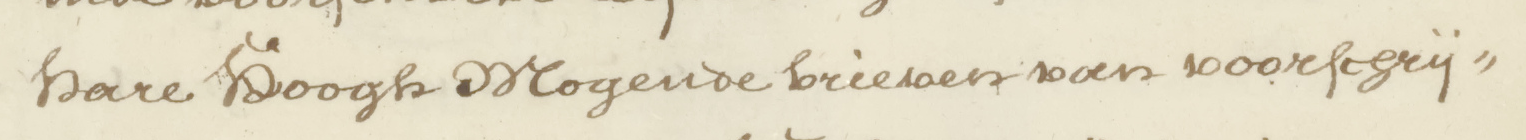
hare Hoogh Mogende brieven van voorschrij„
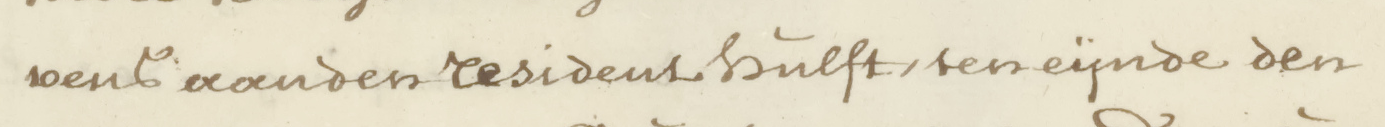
vens aanden resident Hulst, ten eijnde den
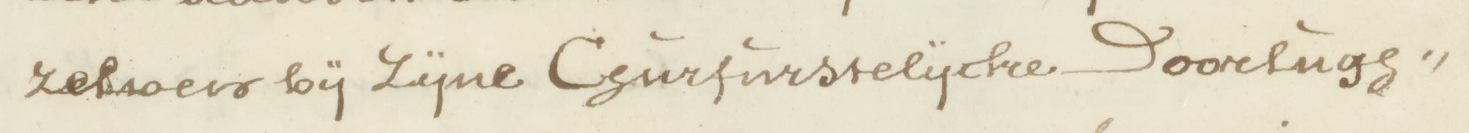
zelvers bij Zijne Churfurstelijcke Doorlugh„
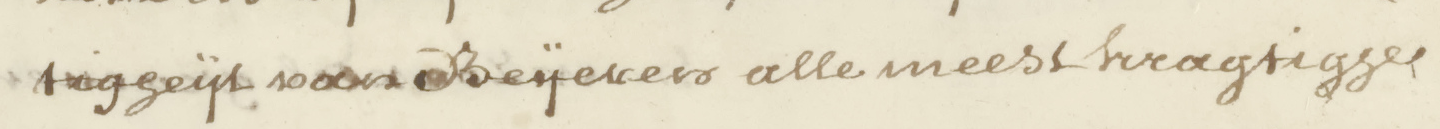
tigheijt voor Beijeren alle meest kragtighe
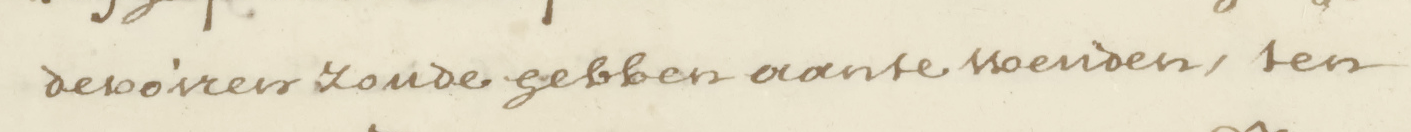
devoiren zoude hebben aan te wenden, ten
